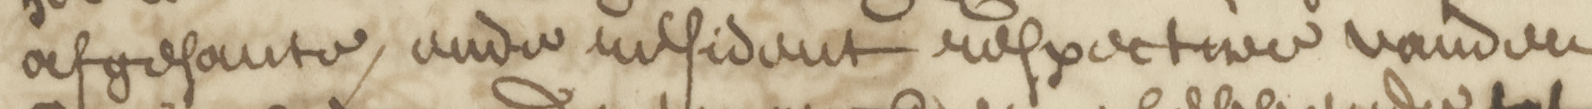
afgesante, ende resident respective vanden
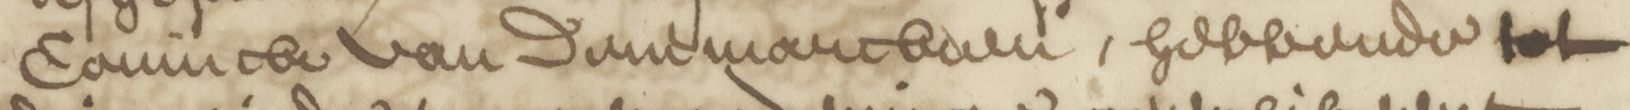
Coninck van Denemarcken, hebbende tot
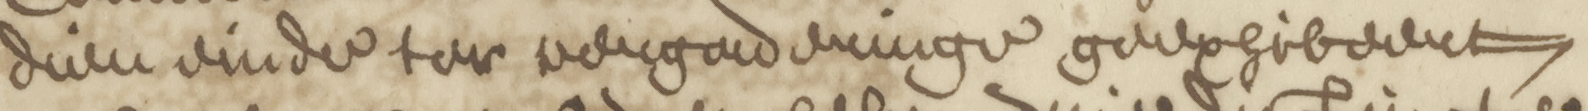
dien einde ter vergaderinge geexhibeert,
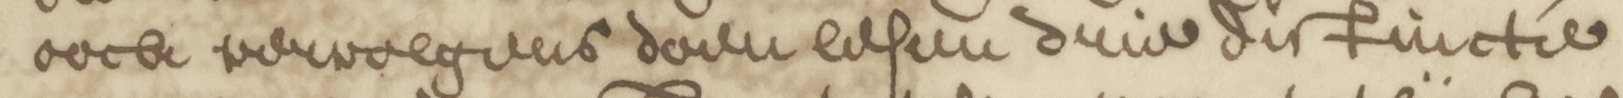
oock vervolgens doen lesen drie distincte
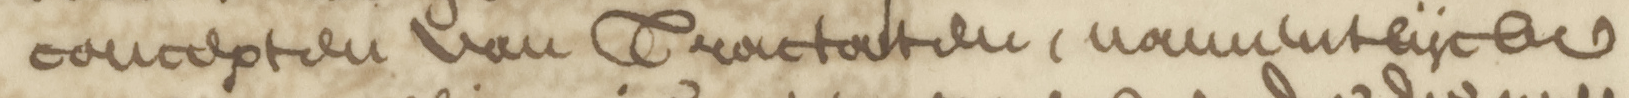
concepten van Tractaten, namentlijck
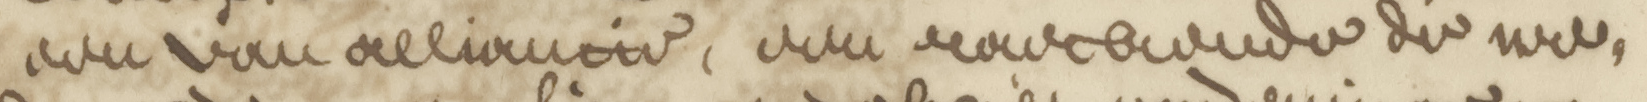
een van alliancie, een raeckende de we,,
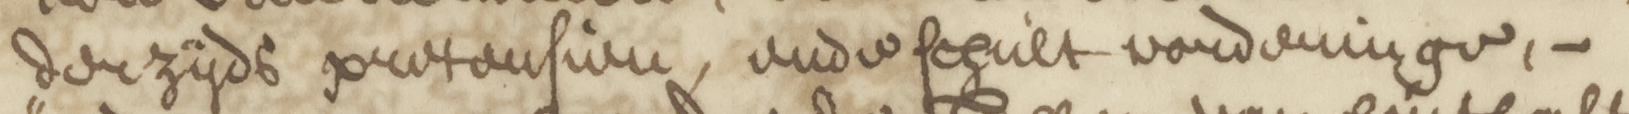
„derzijds pretensien, ende schult vorderinge, -
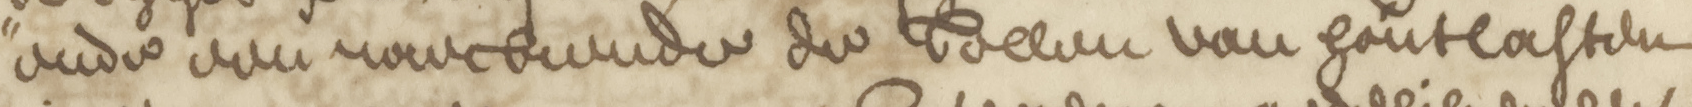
ende een raeckende de Tollen van houtlasten
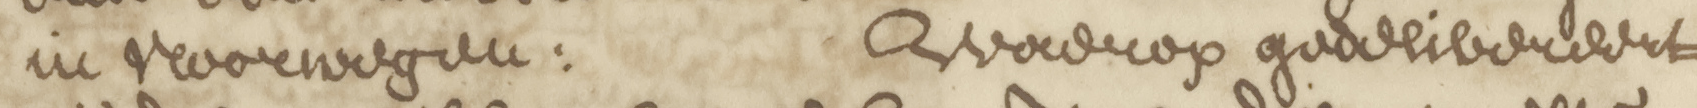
in Noorwegen: Waerop gedelibereert
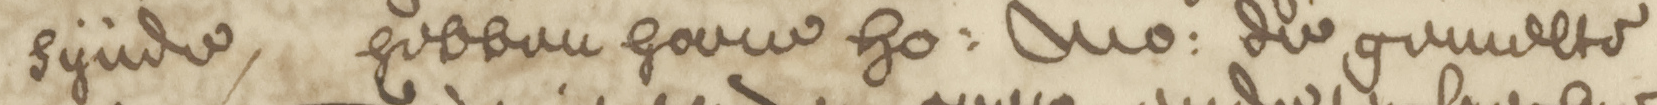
sijnde, hebben hare ho:Mo de gemelte
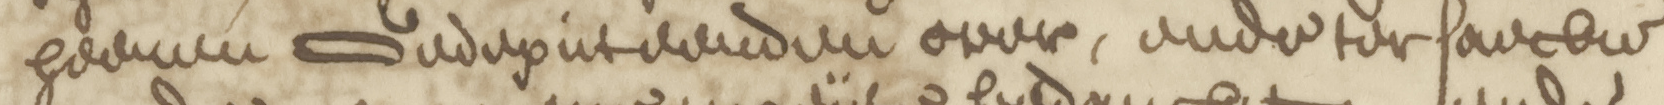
heeren Gedeputeerden over, ende ter saecke
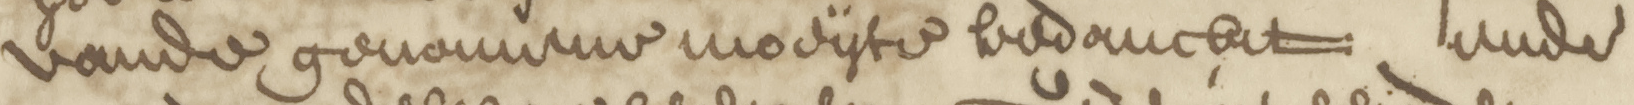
vande genomene moeijte bedanckt ende
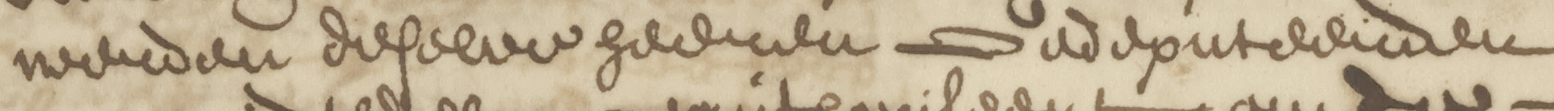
werden deselve heeren Gedeputeerden
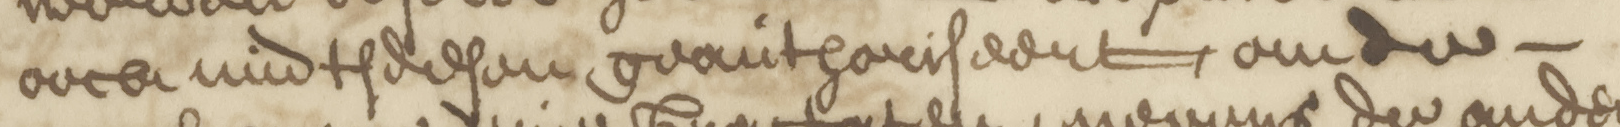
oock midtsdesen geauthoriseert, om de —
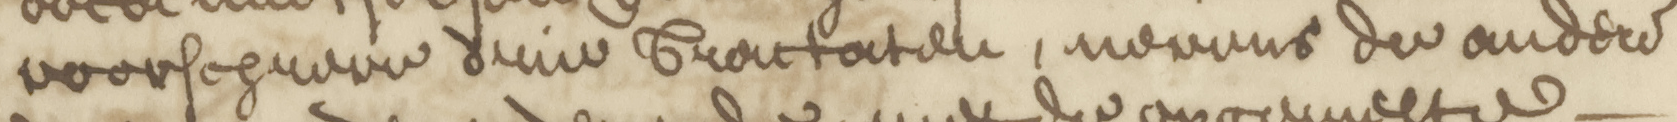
voorschreve drie Tractaten, nevens de andere
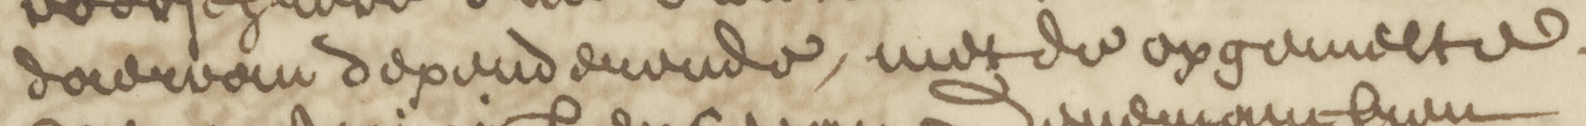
daervan dependerende, met de opgemelte
